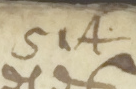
514
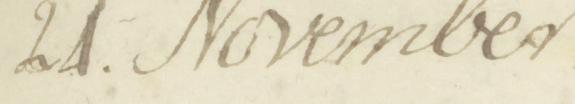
24. November.
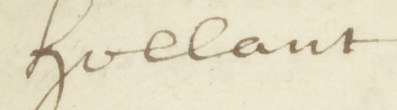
Hollant
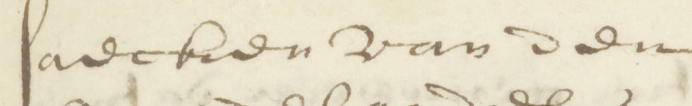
Saecken van den
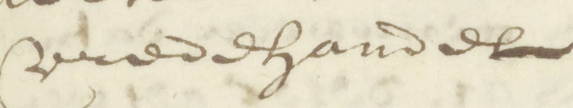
vredehandel
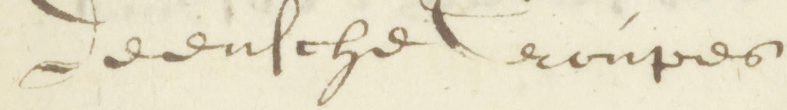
Deensche Troupes
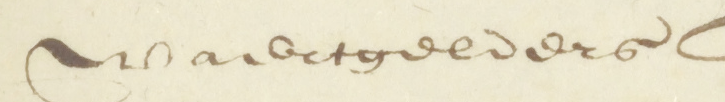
Waertgelders
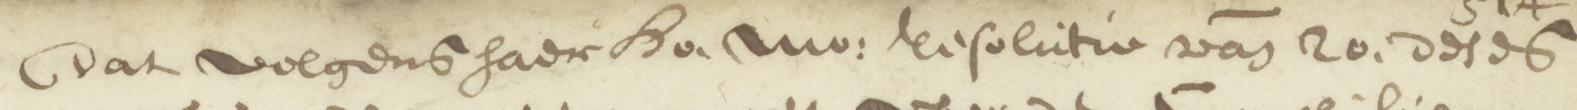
dat volgens haer Ho:Mo: resolutie van 20. deses
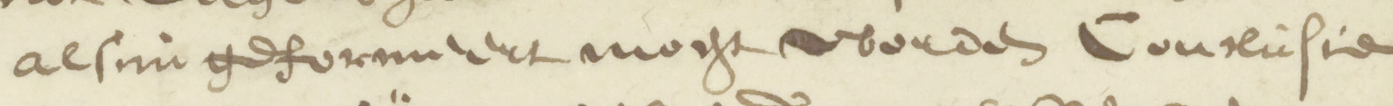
alsnu geformeert mocht worden Conclusie
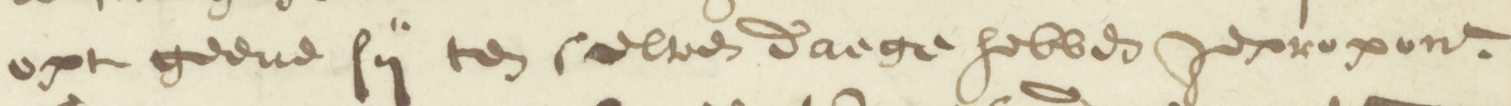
opt geene sij ten selven daege hebben gepropont.
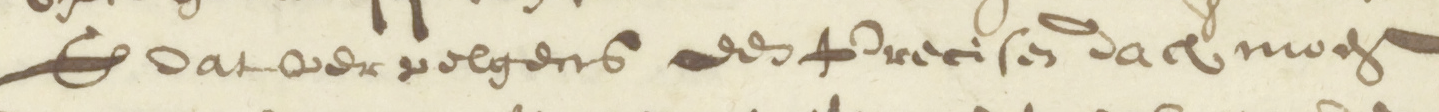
& dat vervolgens een Precisen dach mocht
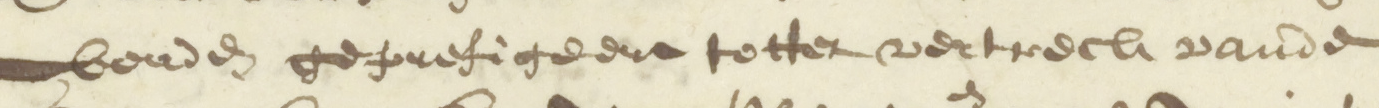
worden geprefigeert tottet vertreck vande
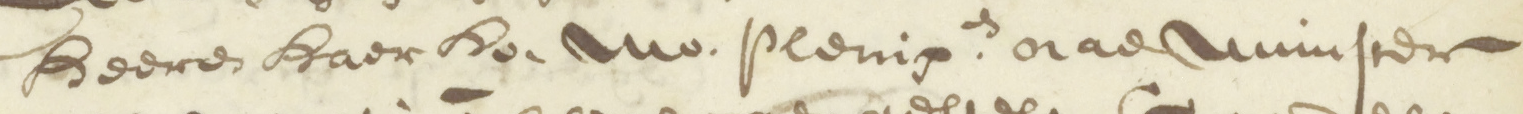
Heeren Haer Ho:Mo: Plenipen. nae Munster
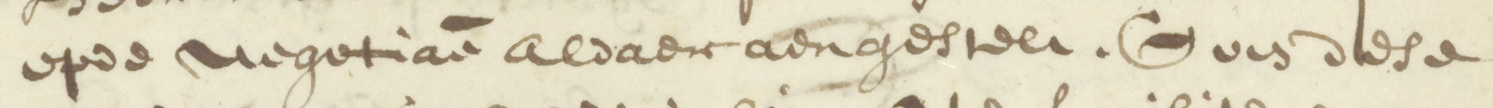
opde negotiae aldaer aengestelt. & om dese
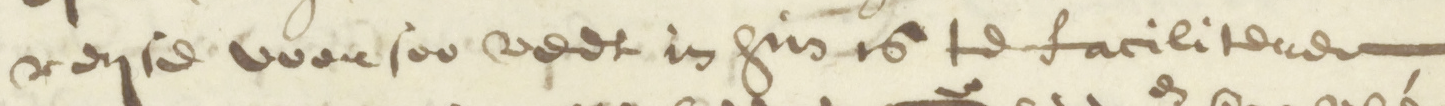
reyse voor soo veel in hun is te faciliteren
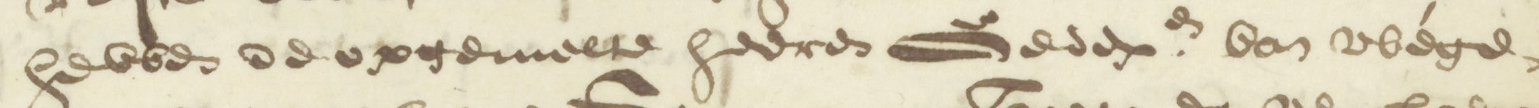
hebben de opgemelte heeren Gedepen. van wegen
